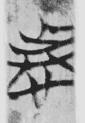者
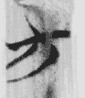方
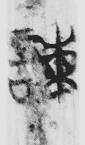諫
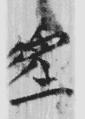𫊟
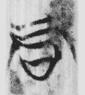君
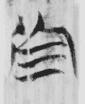於
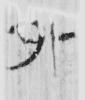外
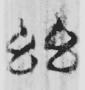𢆶
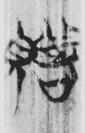{見八言}
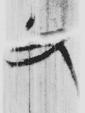父
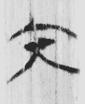內
